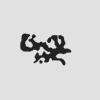望
